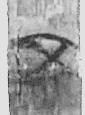五
